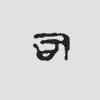司
